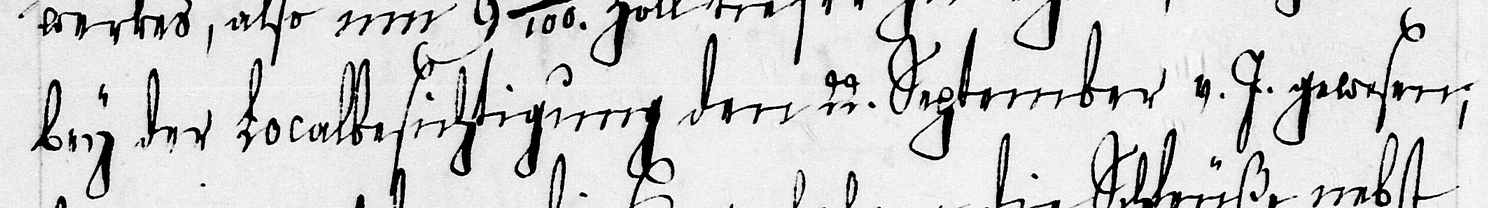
bey der Localbesichtigung den 22. September v. J. gewesen;
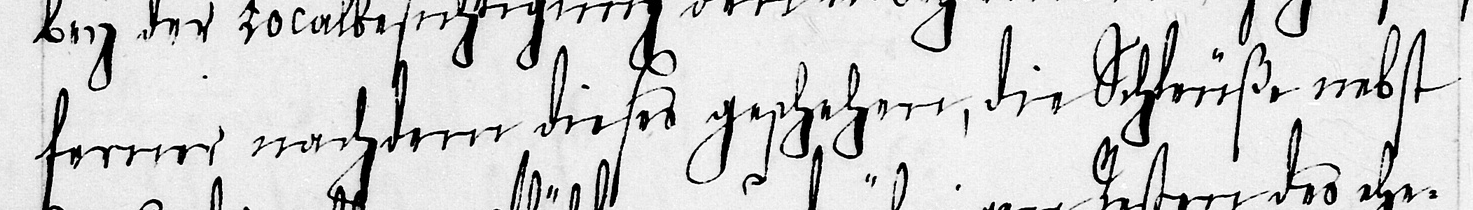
ferner nachdem dieses geschehen, die Schleuße nebst
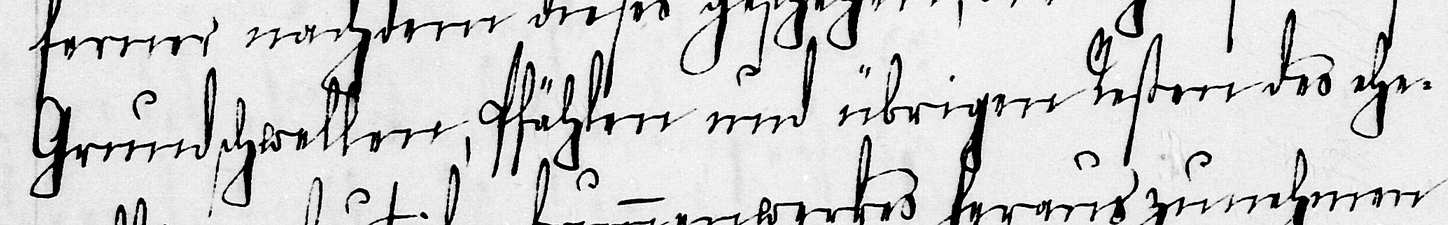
Grundschwellen Pfählen und übrigen Resten des ehe¬
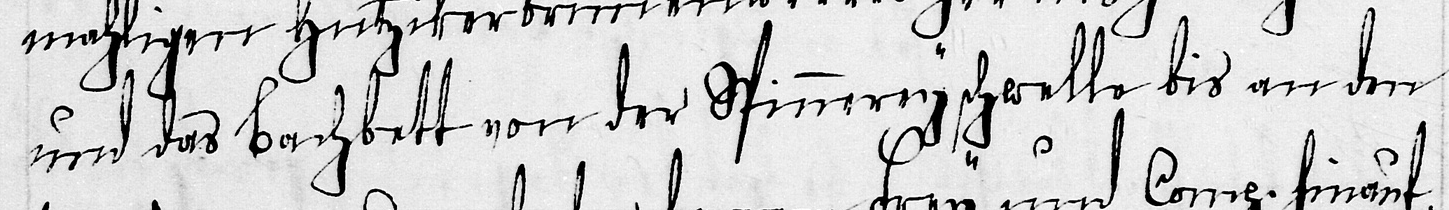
und das Bachbett von der Spinnereyschwelle bis an den
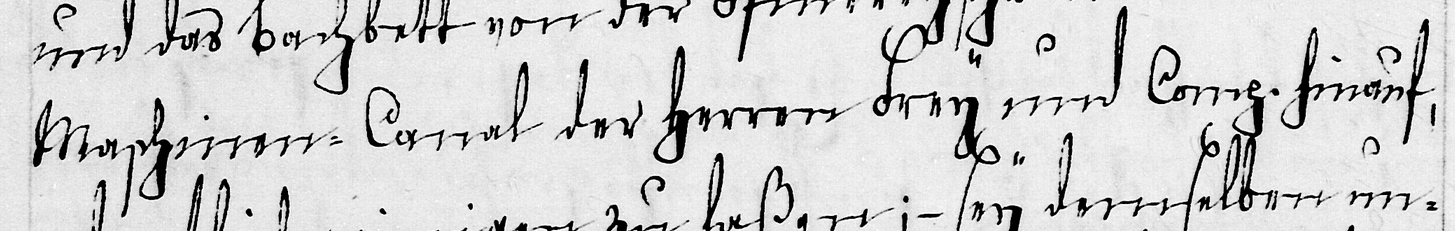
Maschinen-Canal der Herren Frey und Comp. hinauf,
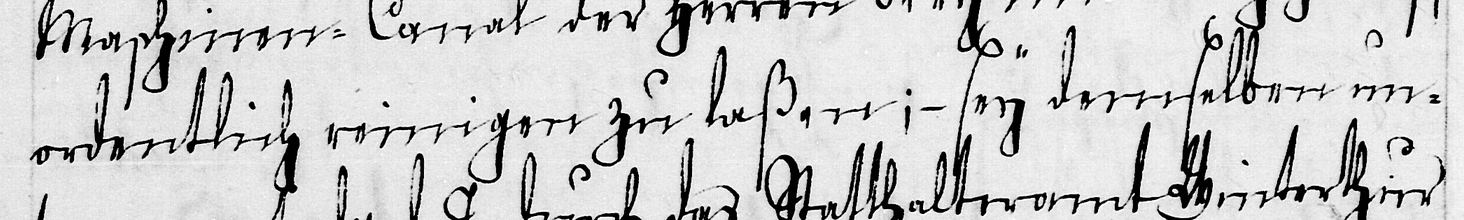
ordentlich reinigen zu laßen; – sey demselben un¬
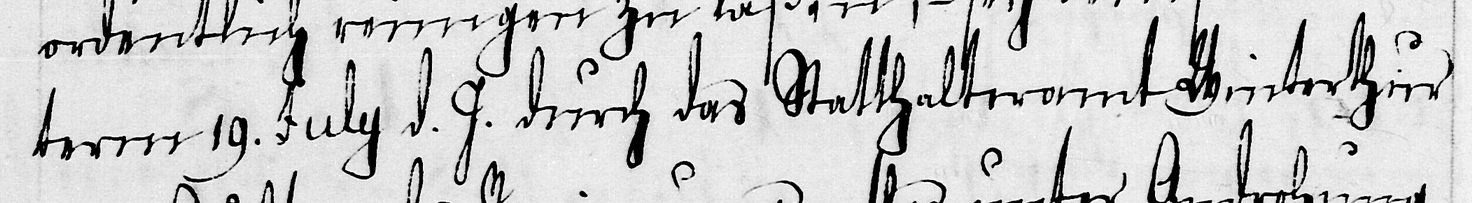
term 19. July d. J. durch das Statthalteramt Winterthur
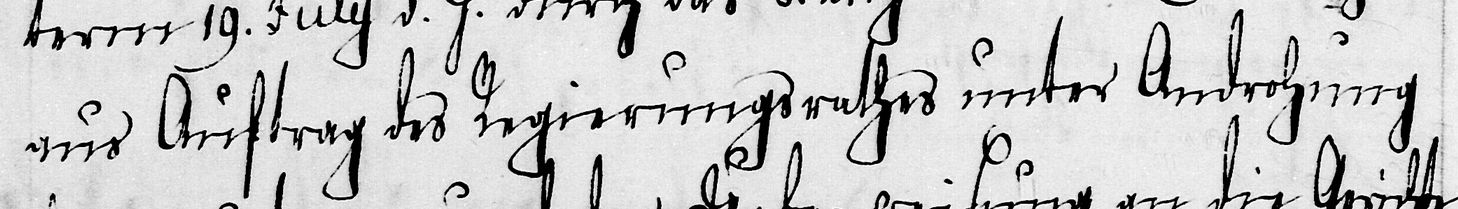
aus Auftrag des Regierungsrathes unter Androhung
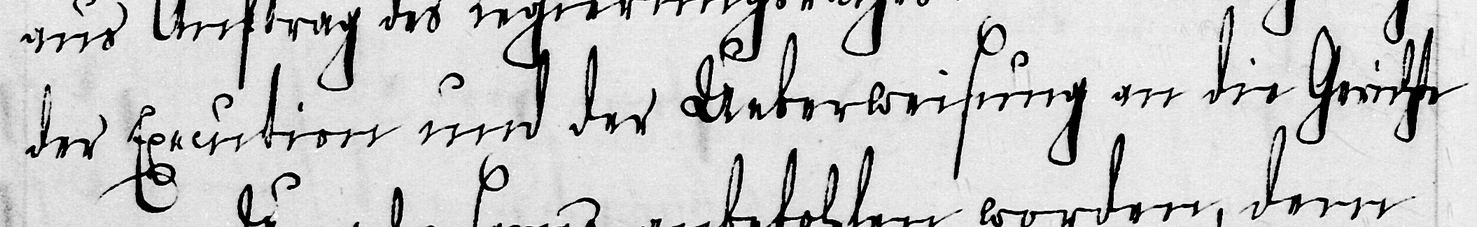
der Execution und der Ueberweisung an die Gerichte
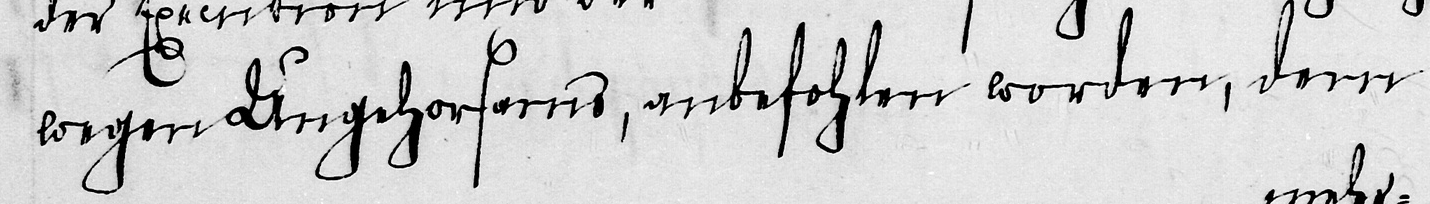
wegen Ungehorsams, anbefohlen worden, dem
